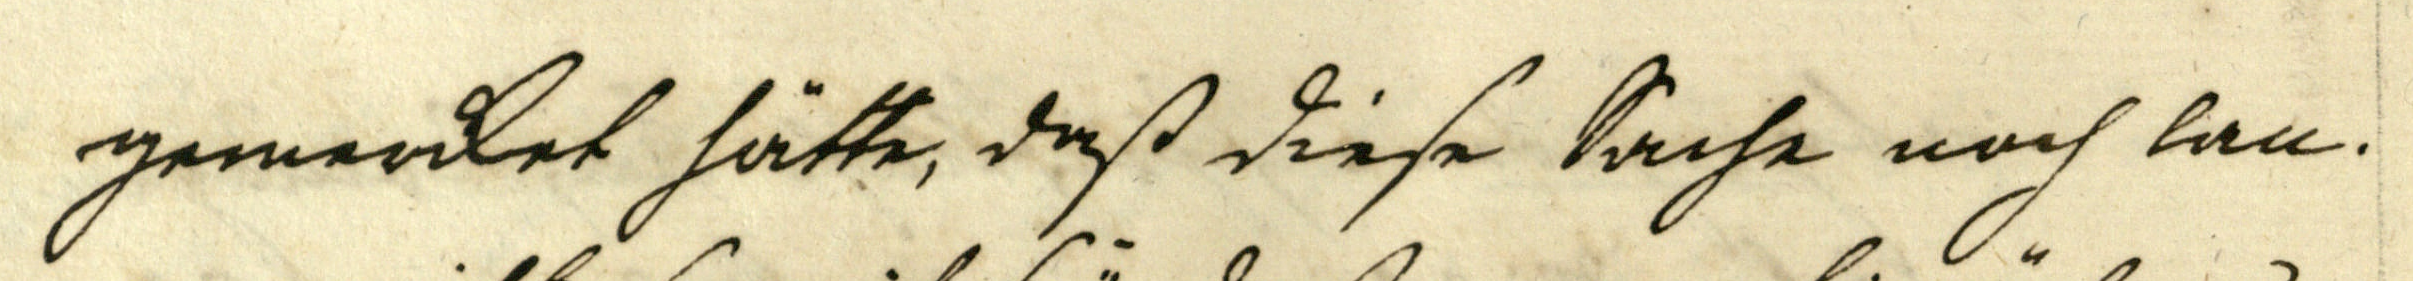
gemercket hätte, daß diese Sache noch lan¬
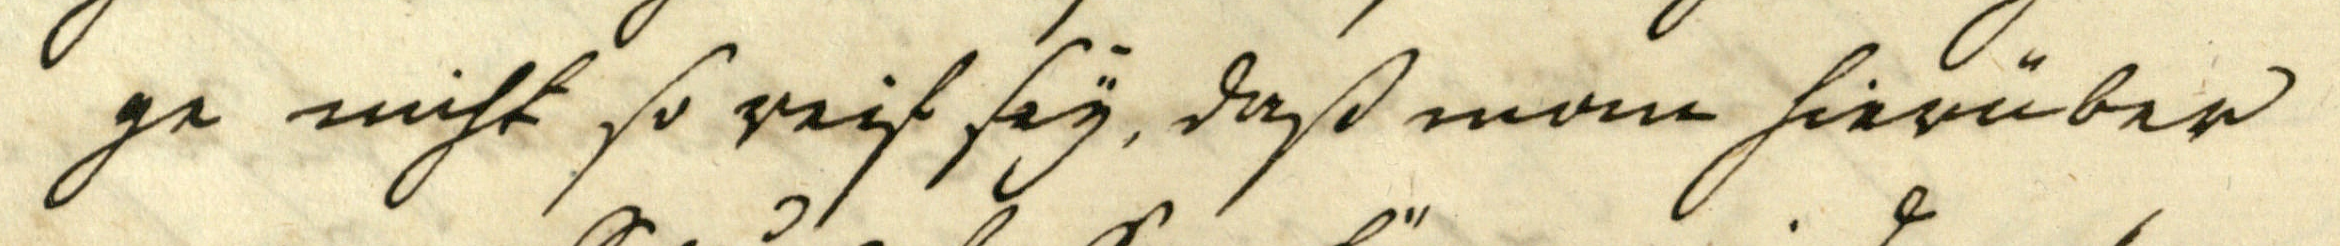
ge nicht so reif seÿ, daß man hierüber
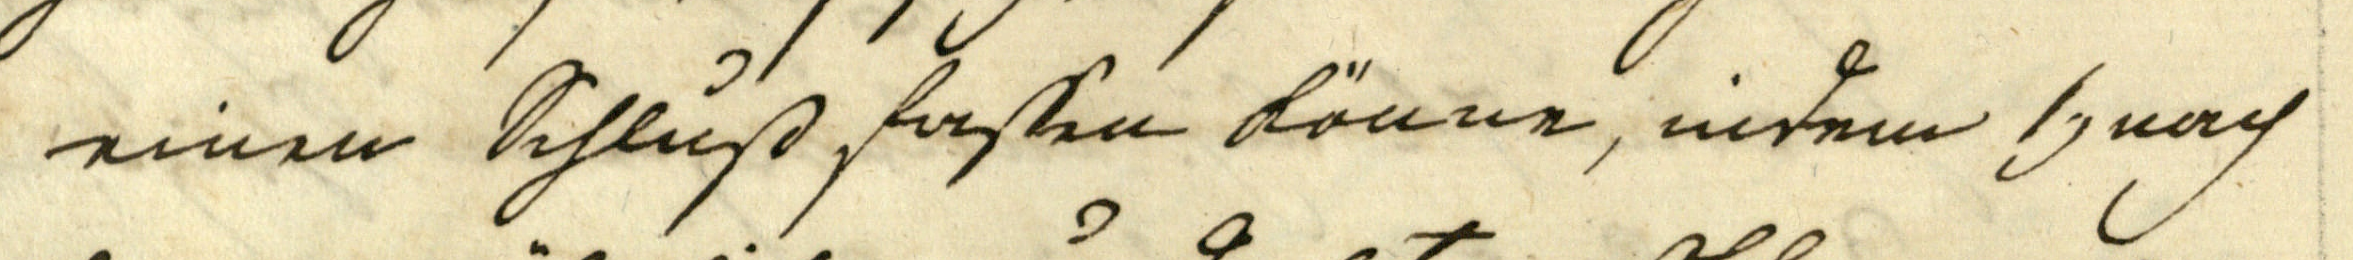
einen Schluß fassen könne, indem 1., nach
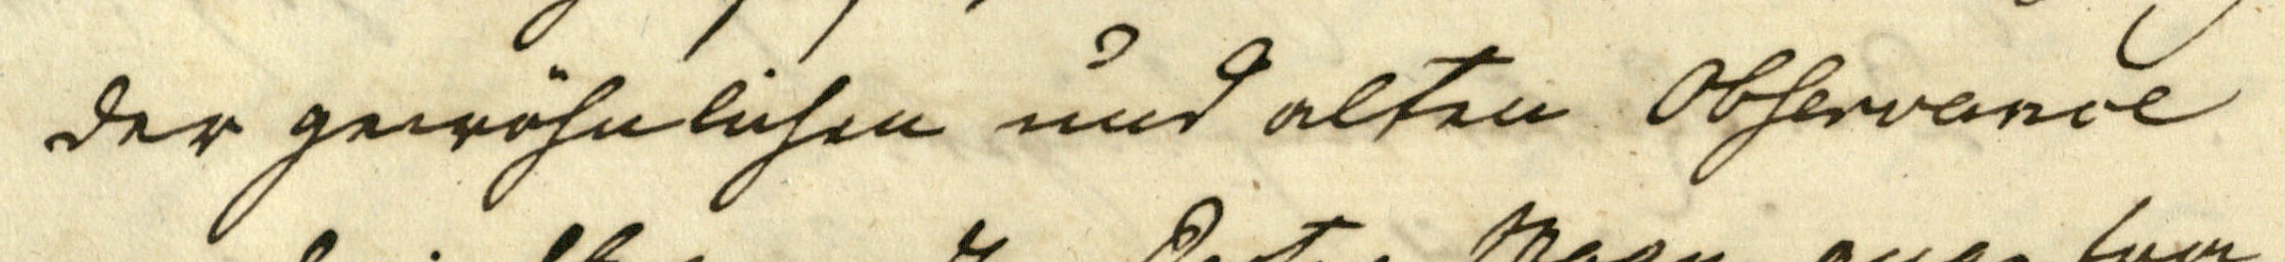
der gewöhnlichen und alten Observance
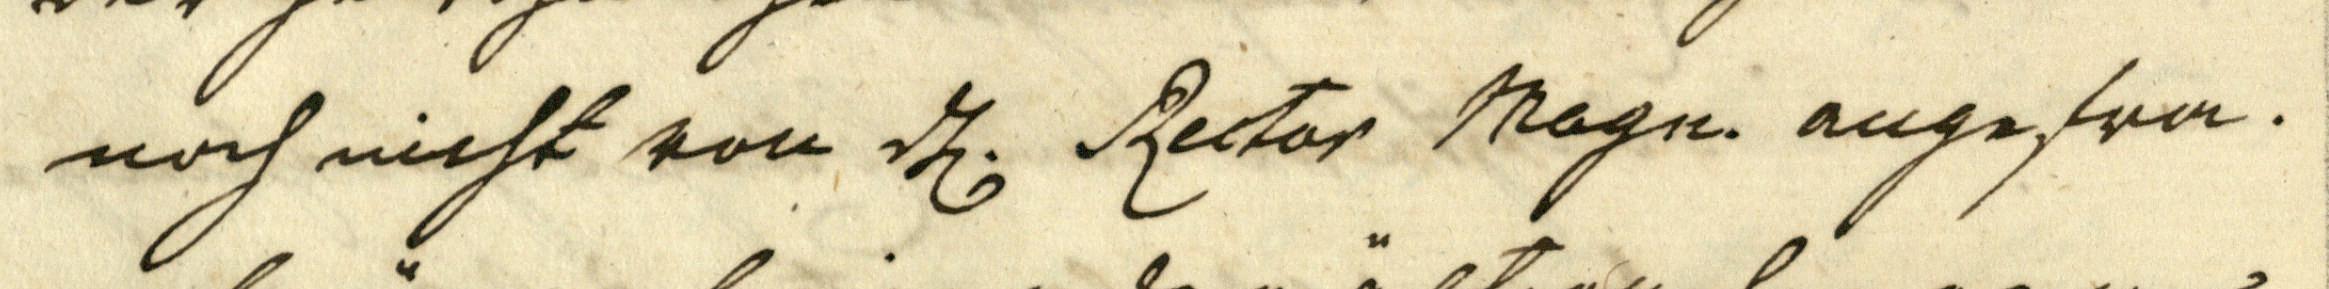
noch nicht von dh. Rector Magn. angefra¬
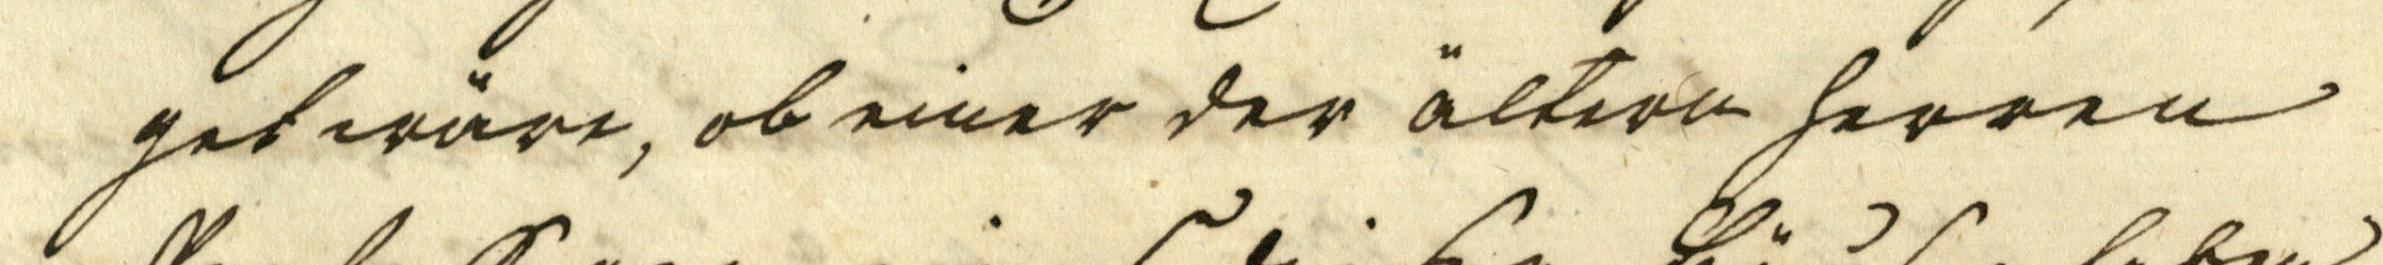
get wäre, ob einer der ältern Herren
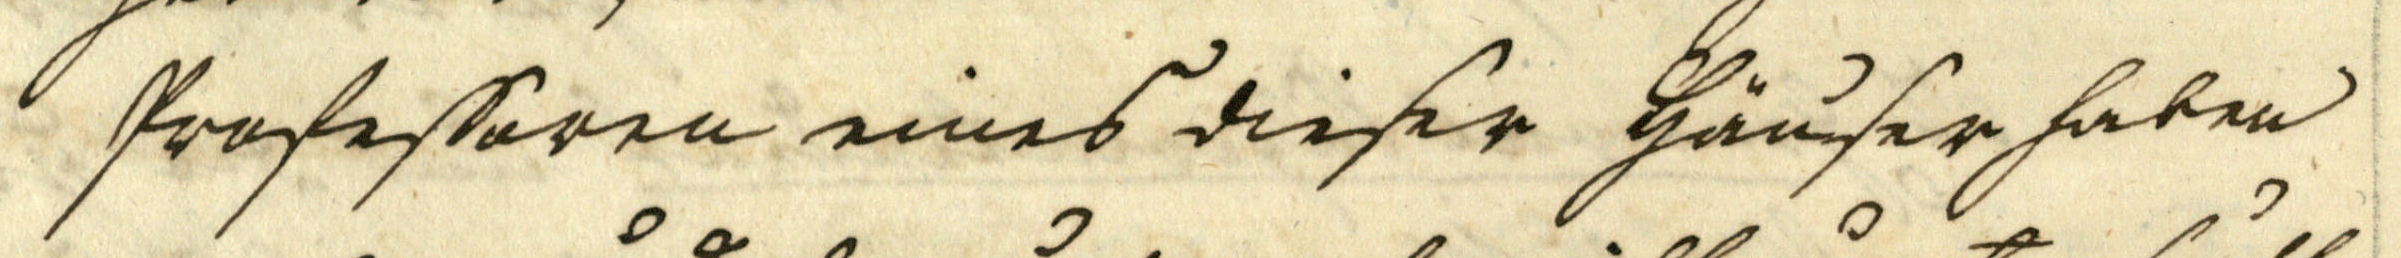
Professoren eines dieser Häuser haben
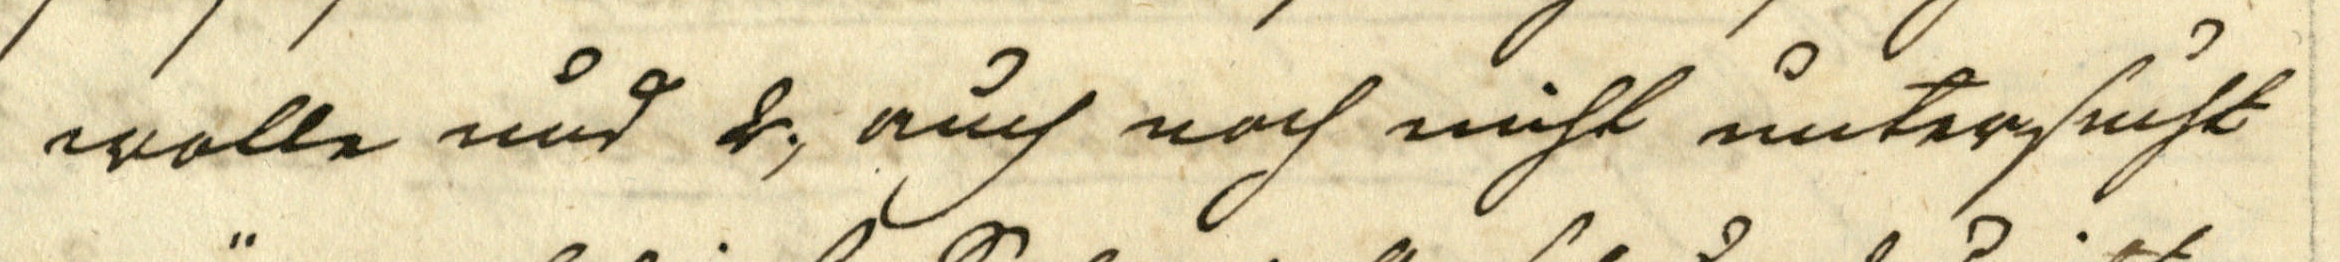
wolle und 2., auch noch nicht untersucht
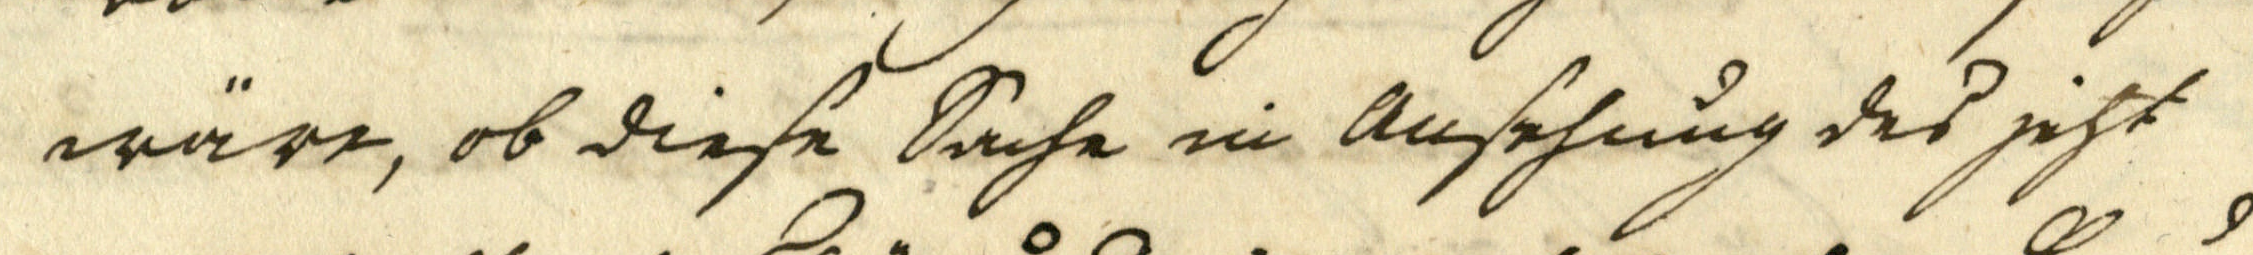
wäre, ob diese Sache in Ansehung des jetzt
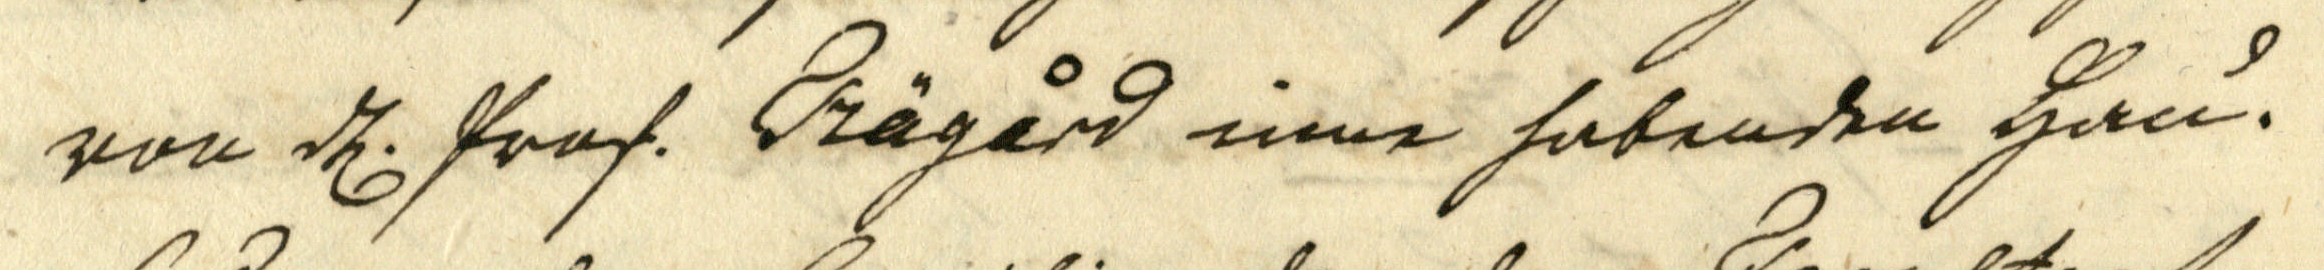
von dh. Prof. Trägård inne habenden Hau¬
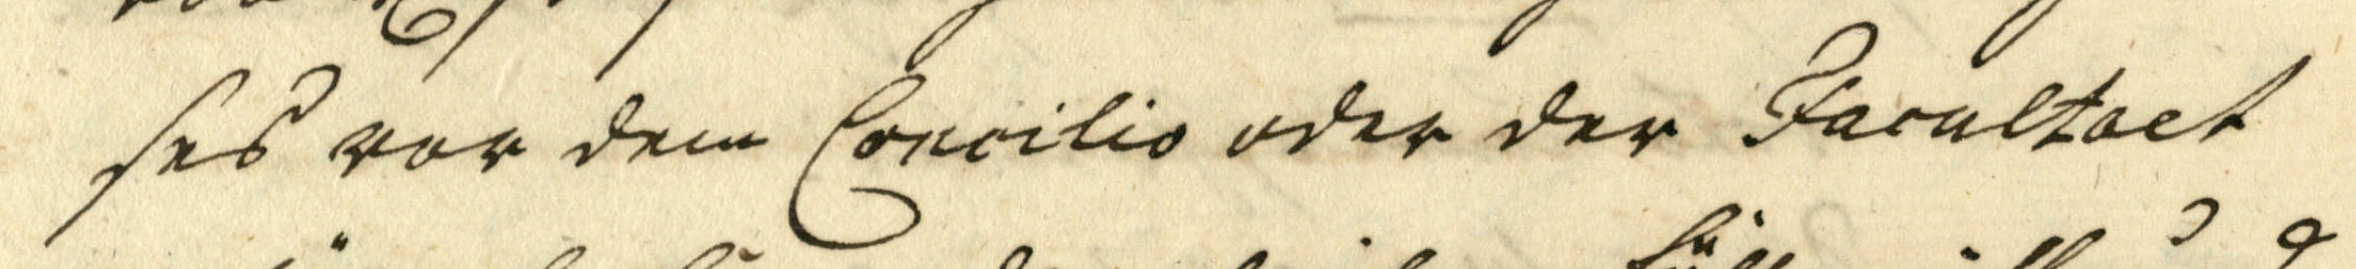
ses vor dem Concilio oder der Facultaet
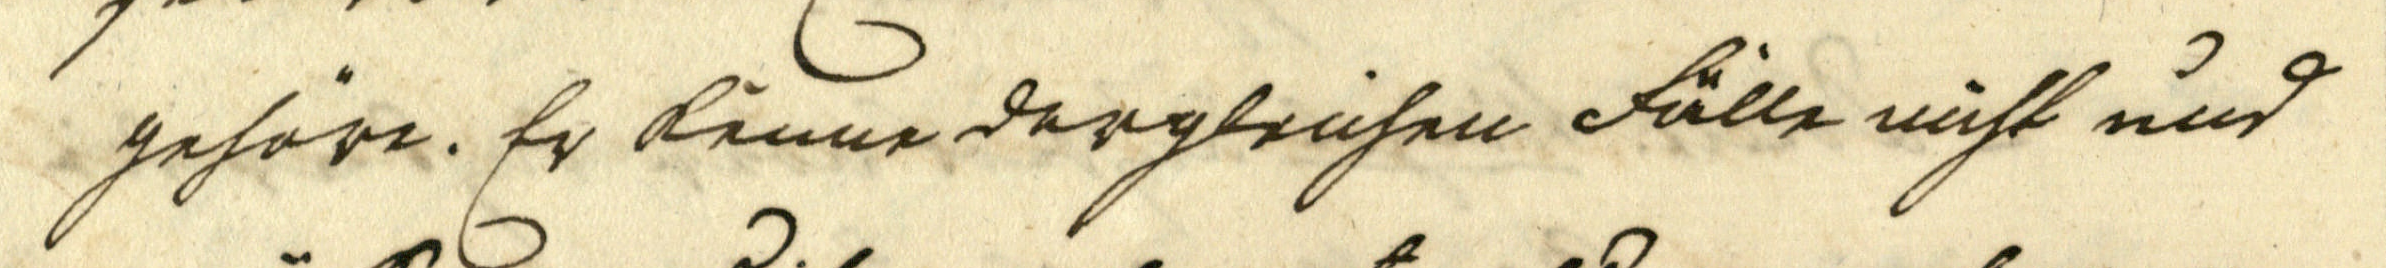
gehöre. Er kenne dergleichen Fälle nicht und
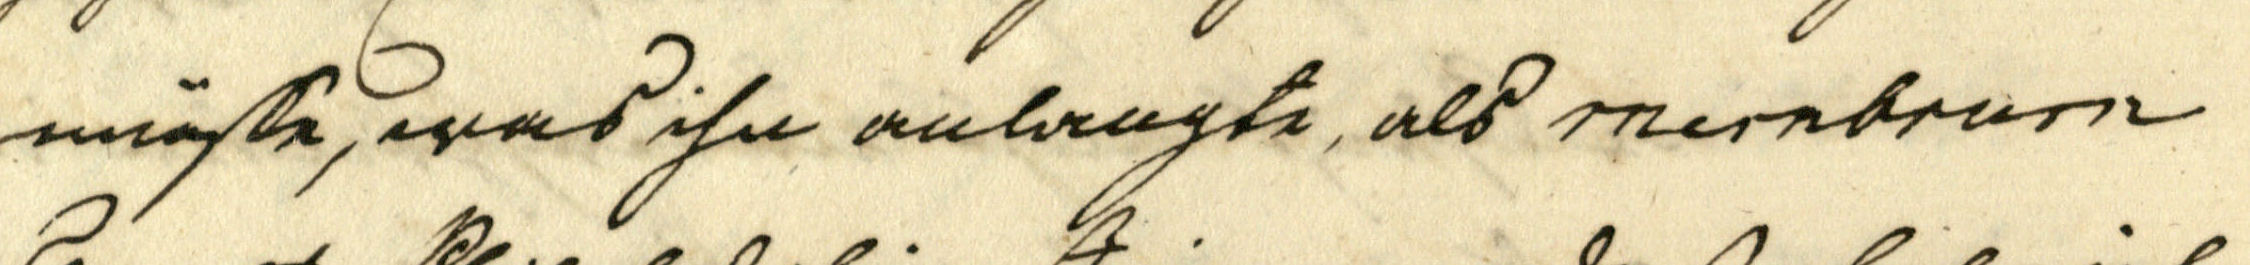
müsse, was ihn anlangte, als membrum
